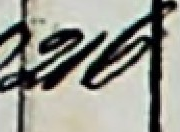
216
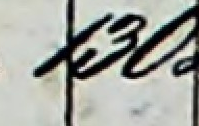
130
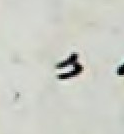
„
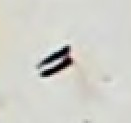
„
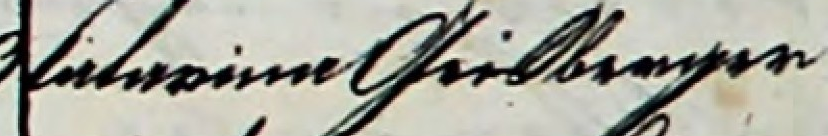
Calarina Geisberger
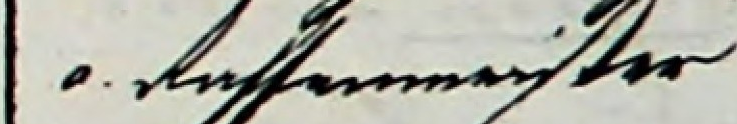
v. Rassenmeister
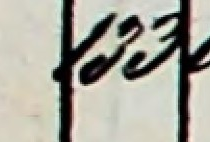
133
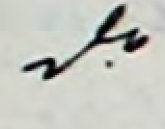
do
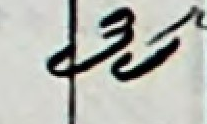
35
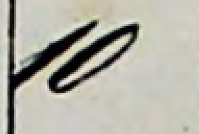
10
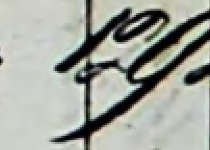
129
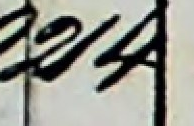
214
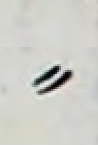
„
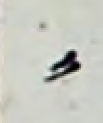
„
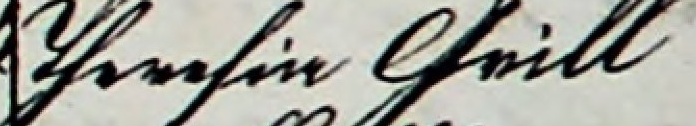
Theresia Grill
